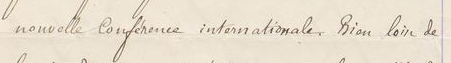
nouvelle Conférence internationale. Bien loin de
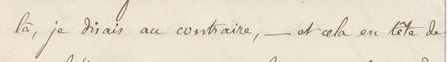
là, je disais au contraire, – et cela en tête de
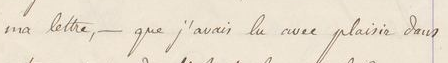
ma lettre, – que j'avais lu avec plaisir dans
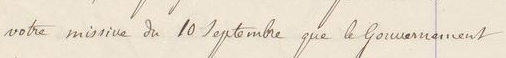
votre missive du 10 Septembre que le Gouvernement
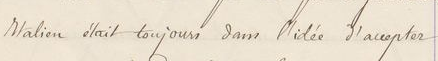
Italien était toujours dans l'idée d'accepter
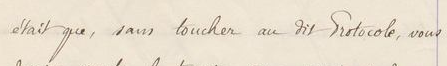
était que, sans toucher au dit Protocole, vous
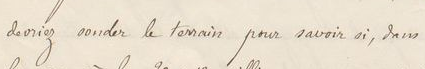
devriez sonder le terrain pour savoir si, dans
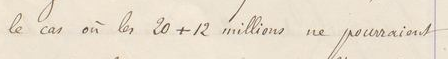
le cas où les 20 + 12 millions ne pourraient
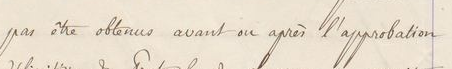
pas être obtenus avant ou après l'approbation
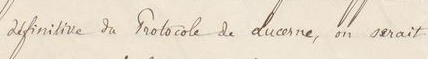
définitive du Protocole de Lucerne, on serait
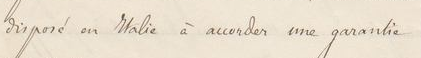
disposé en Italie à accorder une garantie
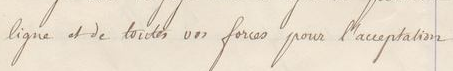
ligne et de toutes vos forces pour l'acceptation
